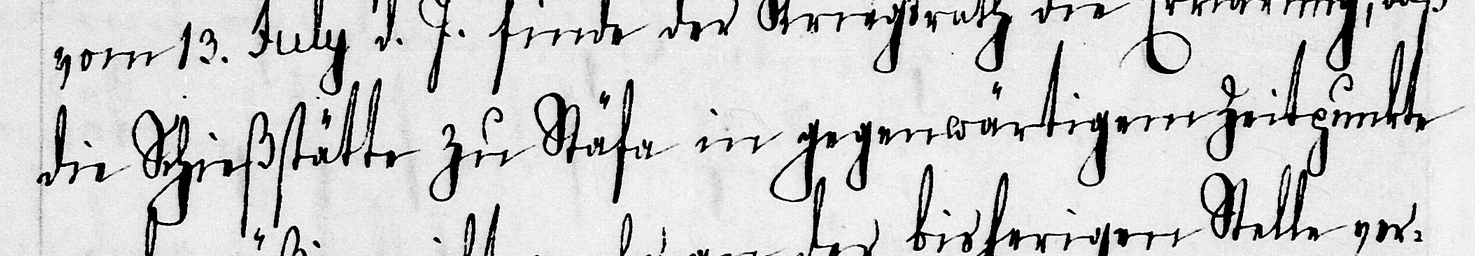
die Schießstätte zu Stäfa in gegenwärtigem Zeitpunkte
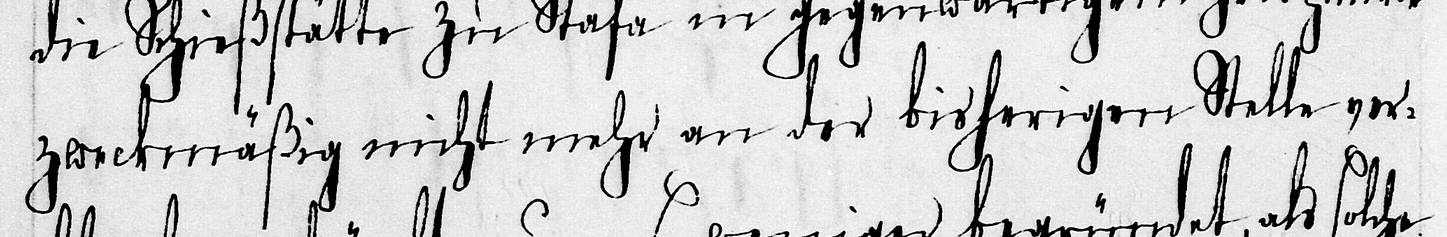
zweckmäßig nicht mehr an der bisherigen Stelle ver¬
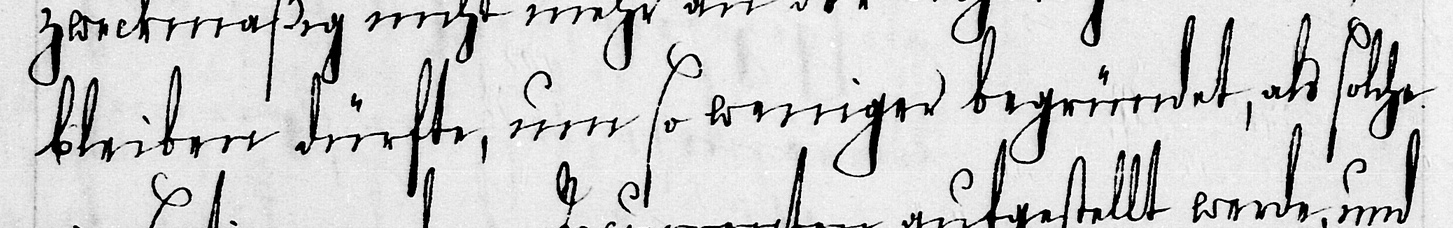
bleiben dürfte, um so weniger begründet, als solche
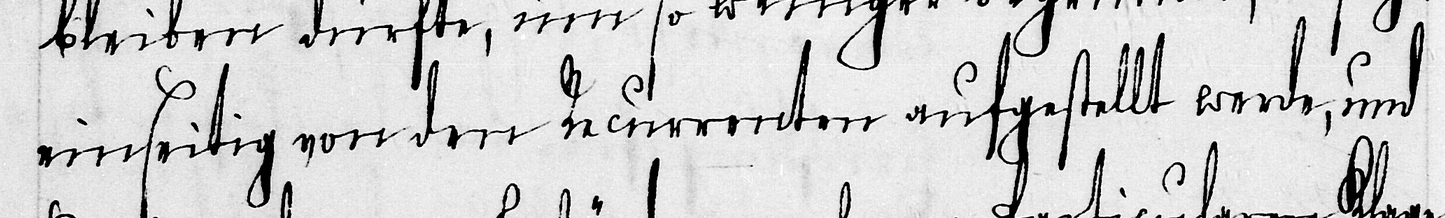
einseitig von den Recurrenten aufgestellt werden, und
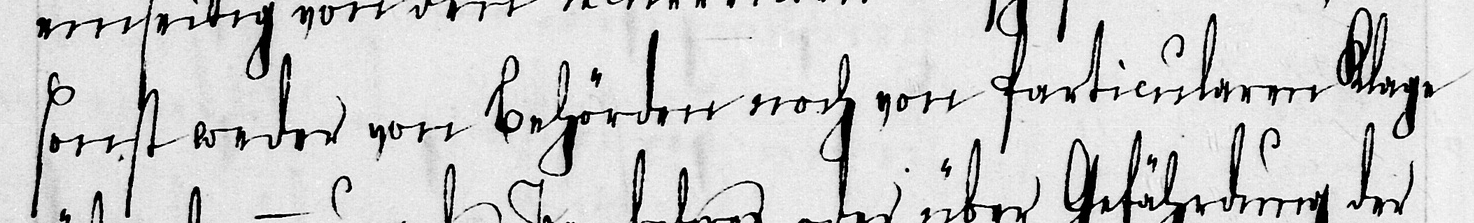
sonst weder von Behörden noch von Particularen Klage
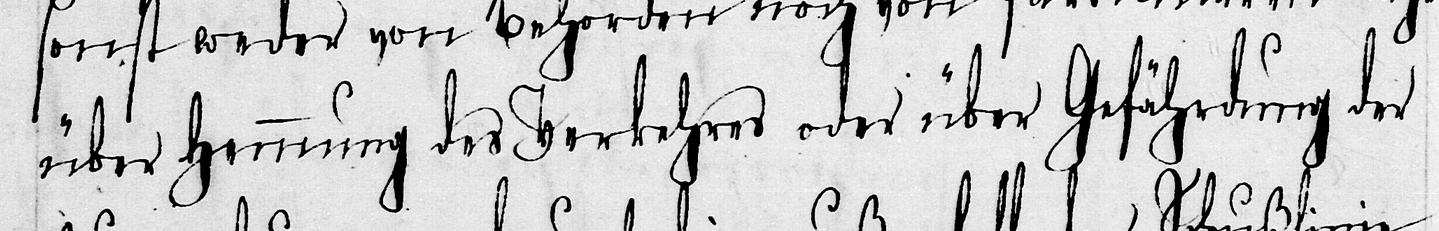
über Hemmung des Verkehrs oder über Gefährdung der
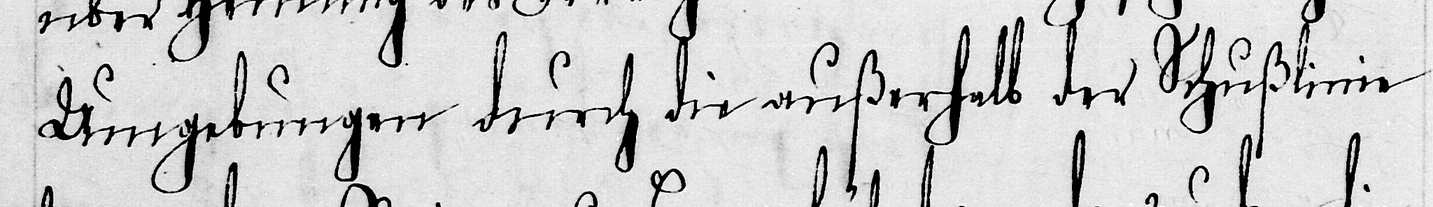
Umgebungen durch die außerhalb der Schußlinie
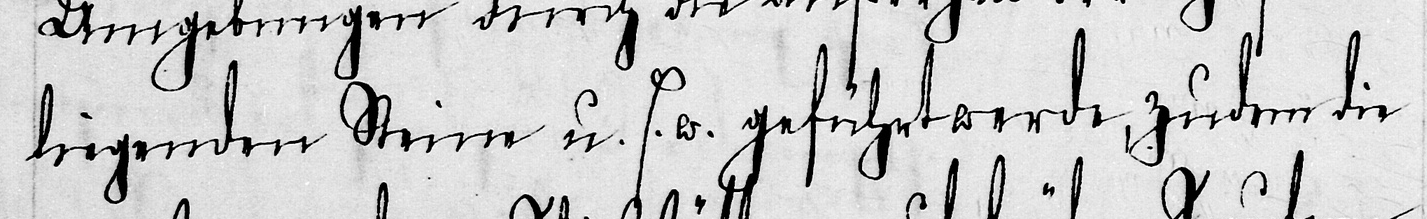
liegenden Steine u. s. w. geführt werde, zudem die
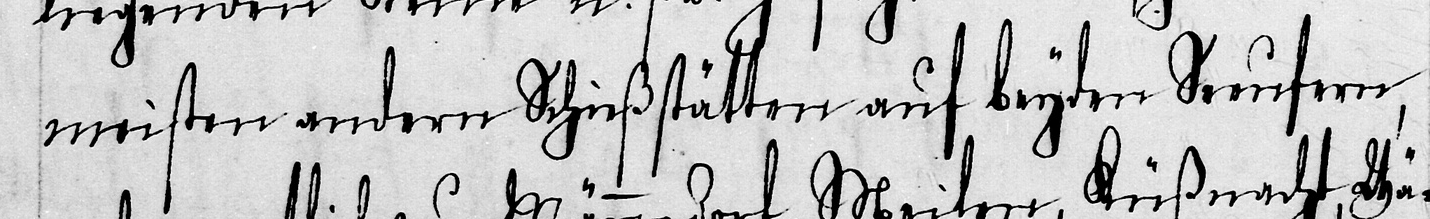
meisten andern Schießstätten auf beyden Seeufern,
